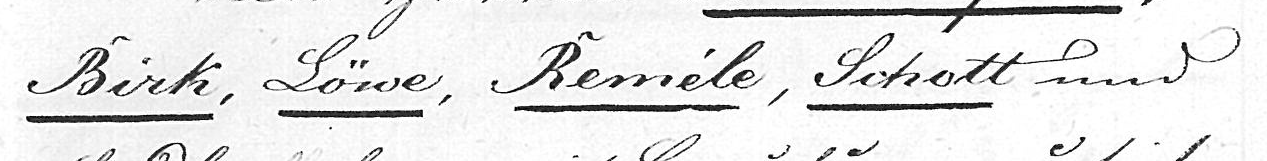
Birk, Löwe, Reméle, Schott und
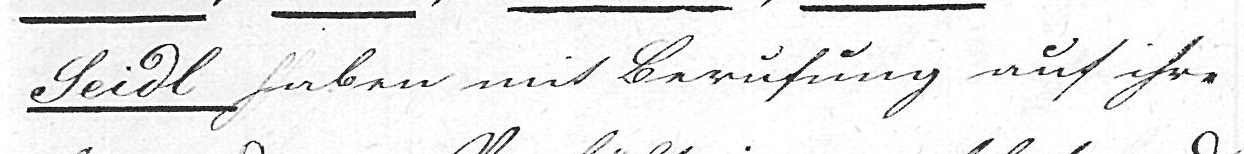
Seidl haben mit Berufung auf ihre-
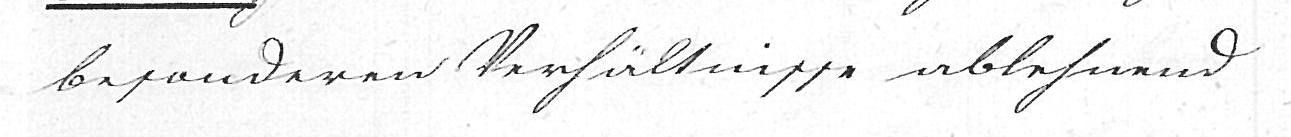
besonderen Verhältnisse ablehnend
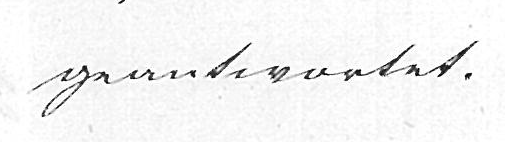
geantwortet.
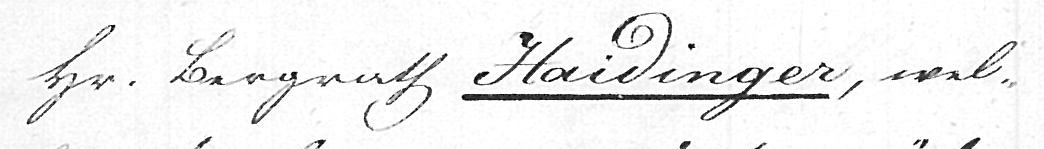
Hr. Bergrath Haidinger, wel-
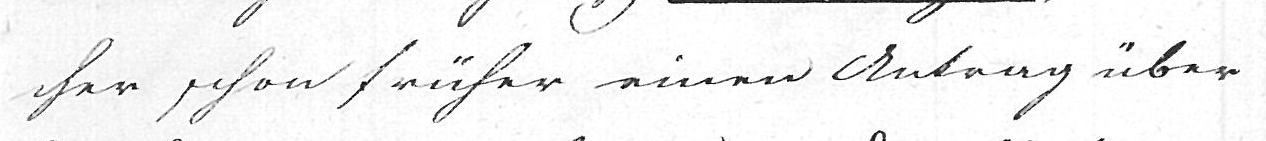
cher schon früher einen Antrag über
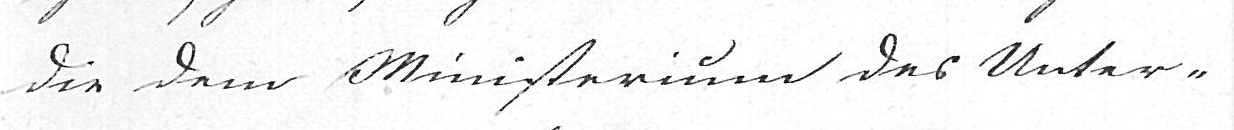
die dem Ministerium des Unter-
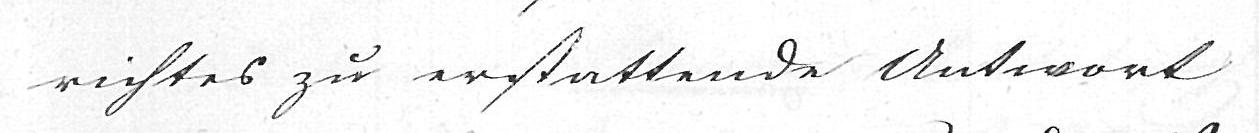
richtes zu erstattende Antwort
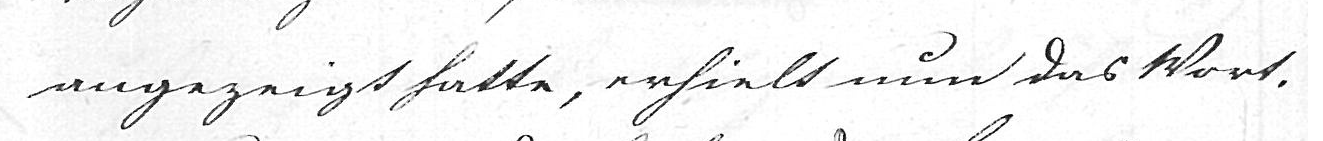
angezeigt hatte, erhielt nun das Wort.
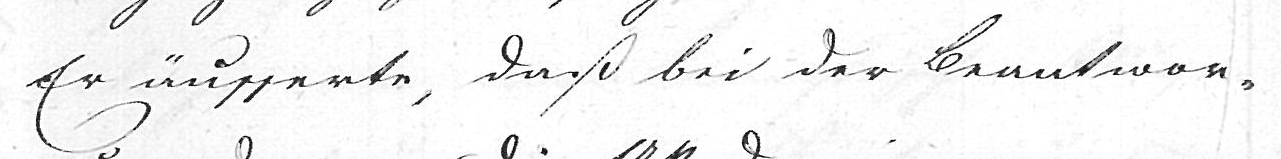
Er äusserte, daß bei der Beantwor-
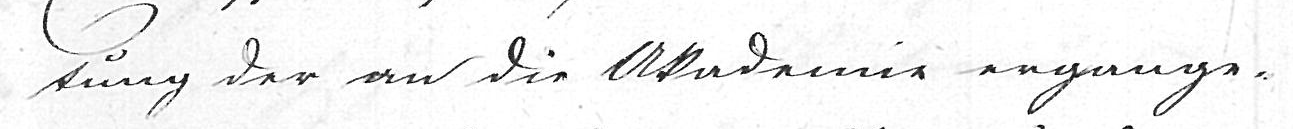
tung der an die Akademie ergange-
